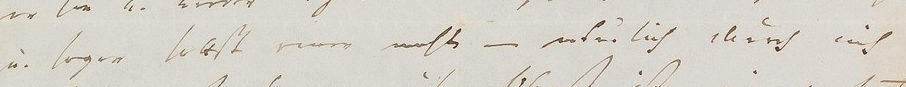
u. sogar selbst einen macht – natürlich durch mich
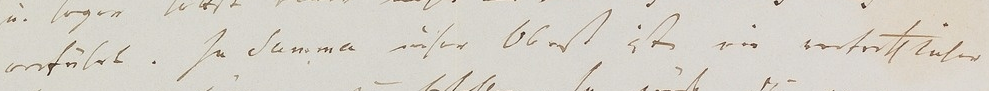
verführt. In Summa unser Oberst ist ein vortrefflicher
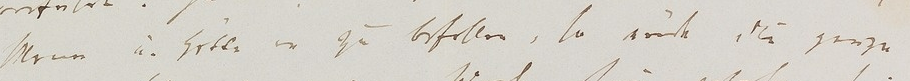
Mann u. hätte er zu befehlen, so würde die ganze
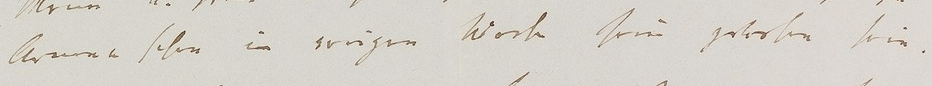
Armee schon in wenigen Wochen heim ge...hen sein.
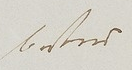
bestens.
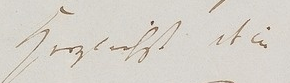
Herzlichst Dein
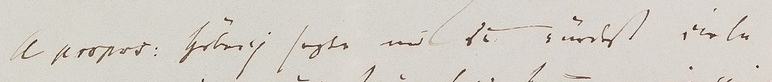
A propos: Häberli sagte mir Du würdest diese
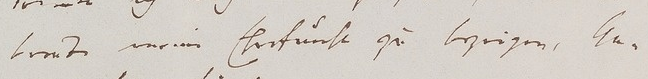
Braut meine Ehrfurcht zu bezeigen, Ge-
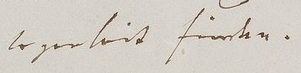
legenheit finden.
